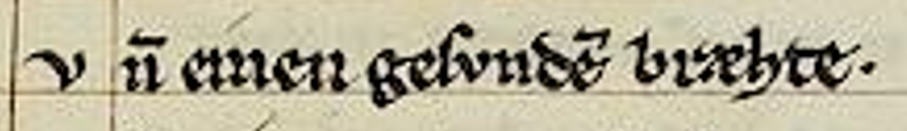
Vn(d) einen geſvnde(n) br[ae]hte.
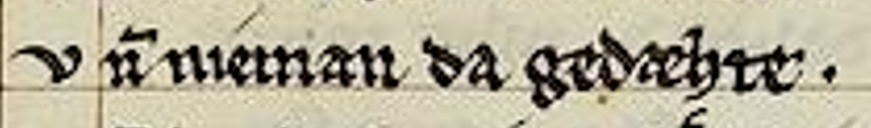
Vn(d) nieman da ged[ae]hte.
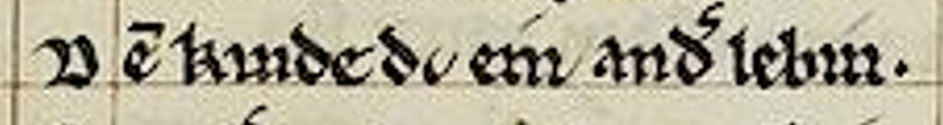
De(m) kinde (daz) ein and(er) lebin.
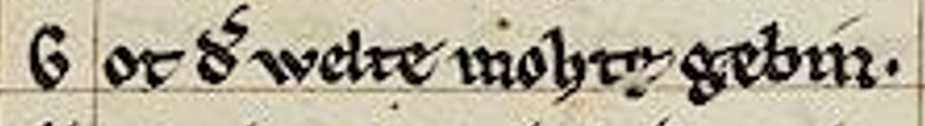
Got d(er) welte mohte gebin.
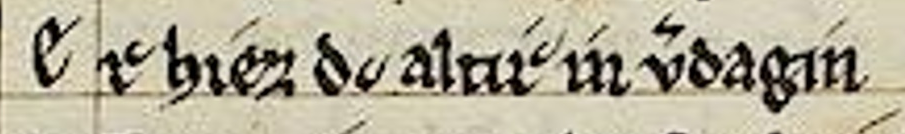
Er hiez d(az) altir in v(er)dagin
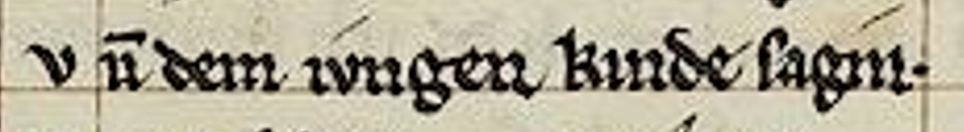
Vn(d) dem ivngen kinde ſagin.
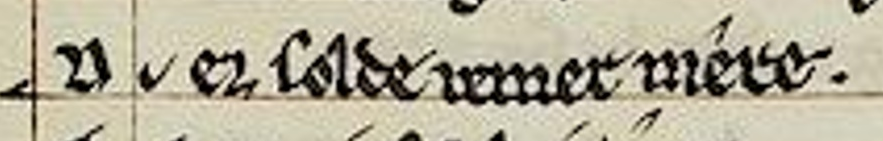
D(az) ez ſolde iemer mere.
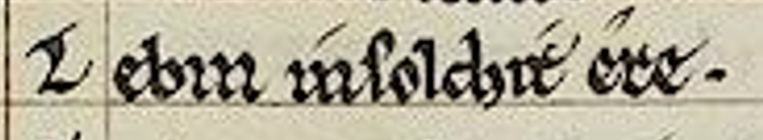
Lebin inſolchir ere.
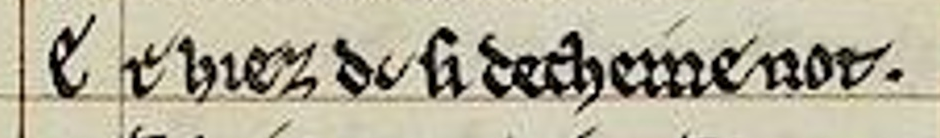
Er hiez d(az) ſi decheine not.
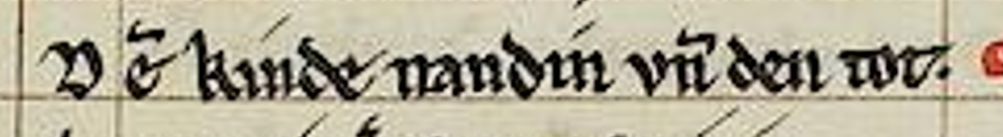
De(m) kinde nandin vn(d) den tot.
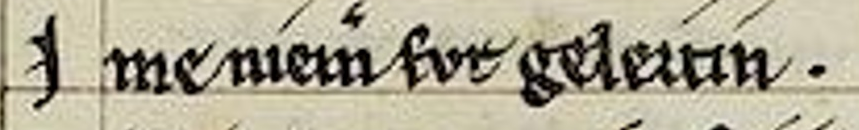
Ime niem(er) fvr geleitin.
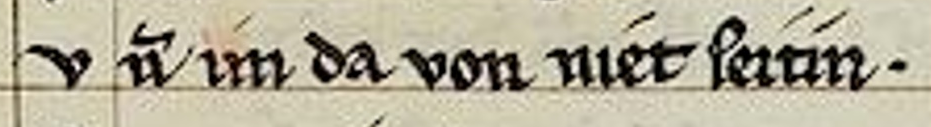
Vn(d) im da von niet ſeitin.
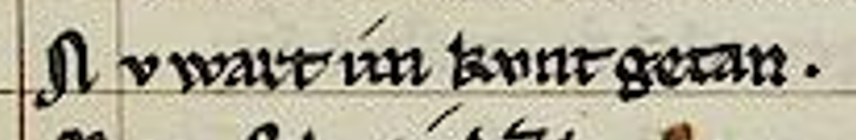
Nv wart im kvnt getan.
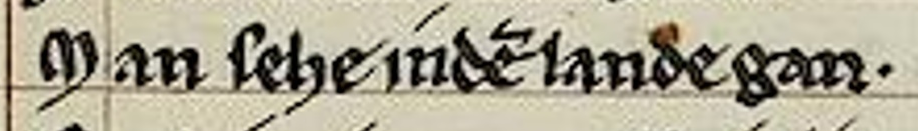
Man ſehe inde(m) lande gan.
